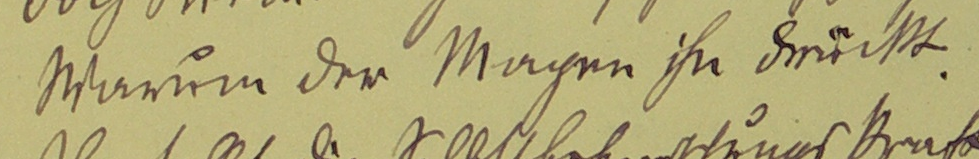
Warum der Magen ihn drückt
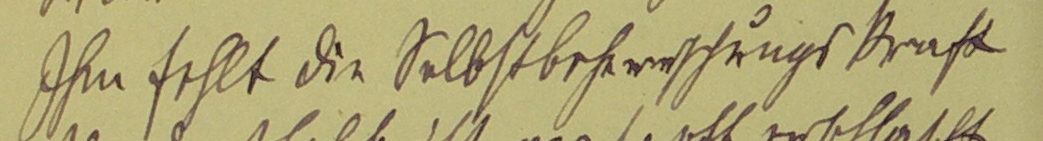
Ihm fehlt die Selbstbeherrschungskraft
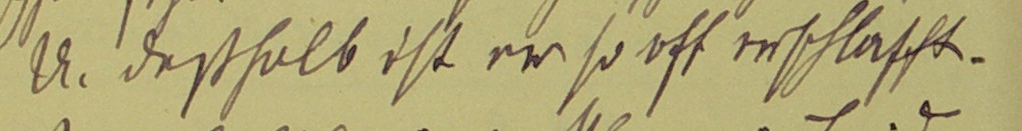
U. deshalb ist er so oft erschlafft.
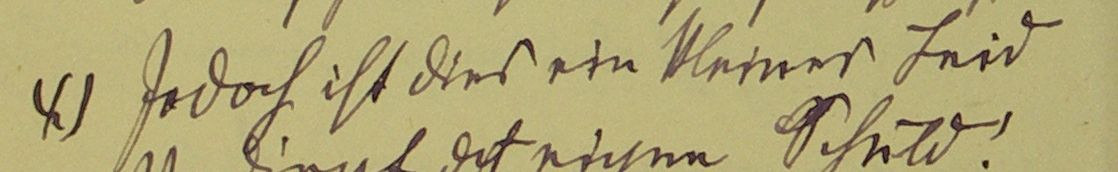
4) Jedoch ist dies ein kleines Leid
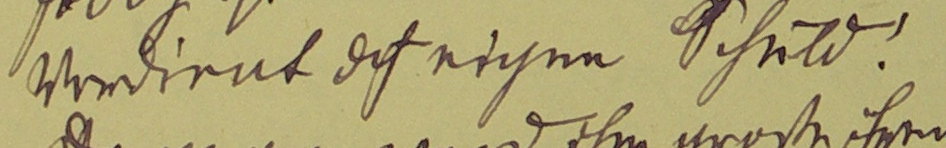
Verdient dt eigene Schuld !
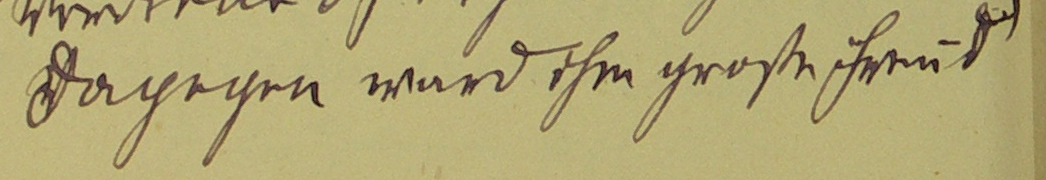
dagegen ward ihm große Freud.
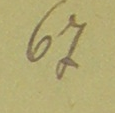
67
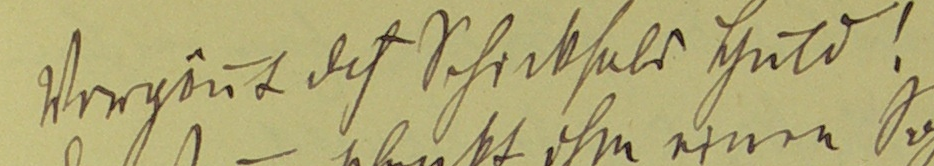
Vergönt dt Schicksals Huld !
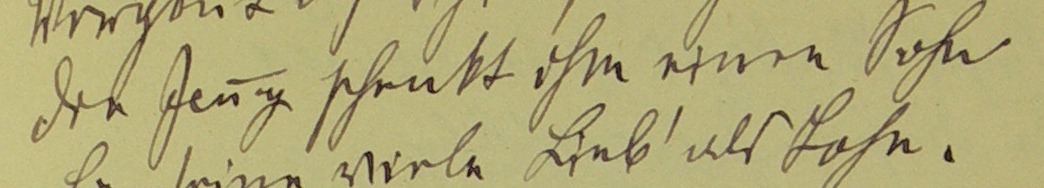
Die Jeny schenkt ihm einen Sohn
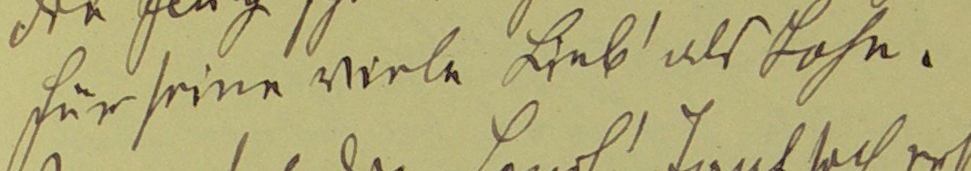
Für seine viele Lieb' als Lohn
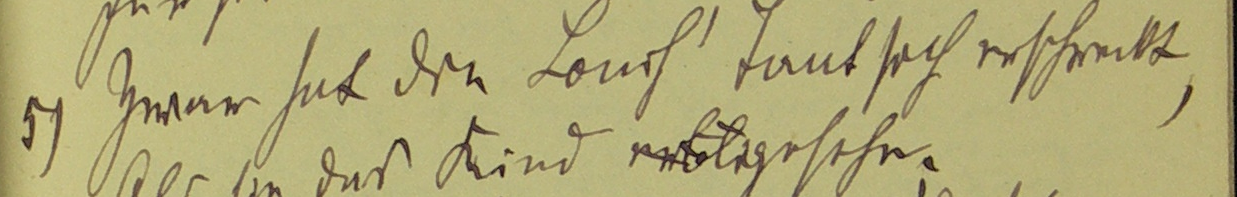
5) Zwar hat die Loui´s Tant sich erschreckt
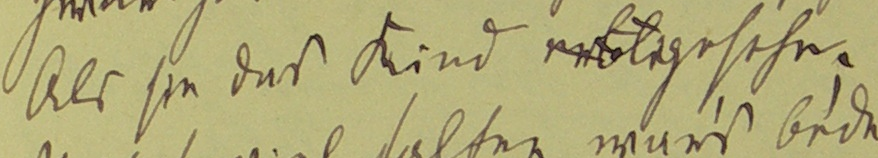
Als sie das Kind ???gesehen
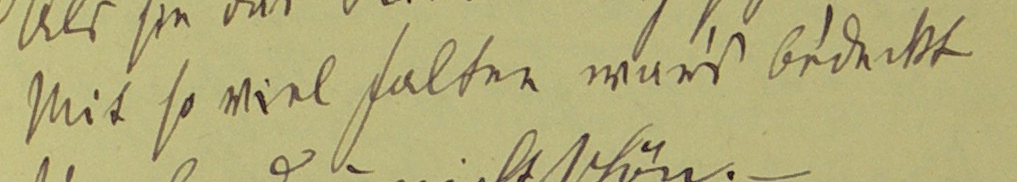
Mit so viel Falten war`s bedeckt
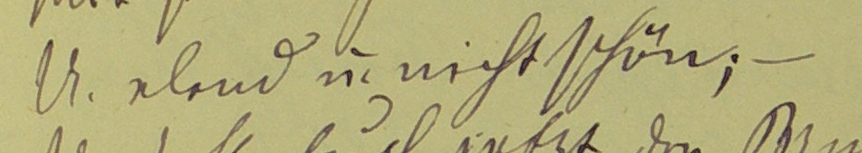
U. elend u. nicht schön; -
